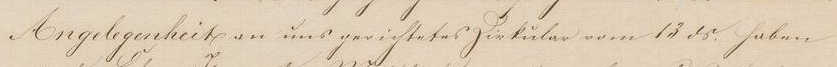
Angelegenheit an uns gerichtetes Zirkular vom 13 ds. haben
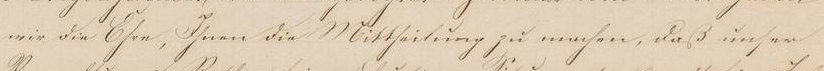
wir die Ehre, Ihnen die Mittheilung zu machen, daß unser
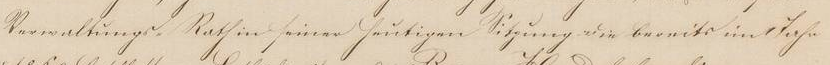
Verwaltungs-Rath in seiner heutigen Sitzung die bereits im Jahr
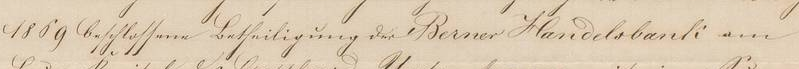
1869 beschlossene Betheiligung der Berner Handelsbank am
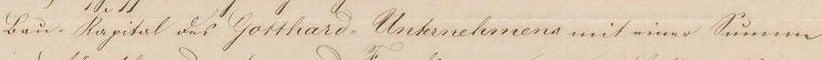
Bau-Kapital des Gotthard-Unternehmens mit einer Summe
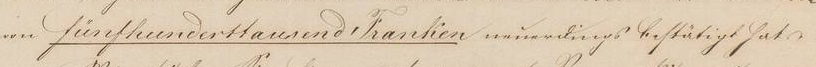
von fünfhunderttausend Franken neuerdings bestätigt hat.
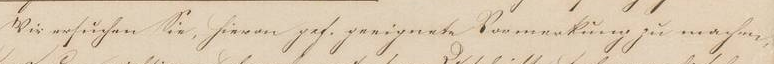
Wir ersuchen Sie, hievon gef. geeignete Vormerkung zu machen,
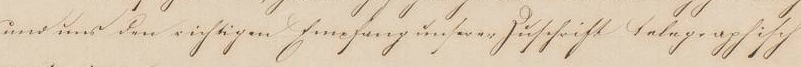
und uns den richtigen Empfang unserer Zuschrift telegraphisch
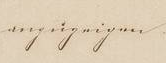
anzuzeigen.
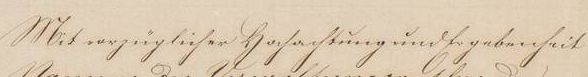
Mit vorzüglicher Hochachtung und Ergebenheit
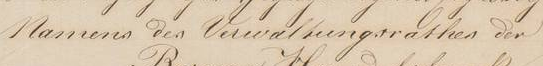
Namens des Verwaltungsrathes der
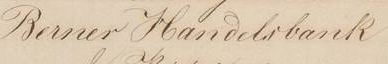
Berner Handelsbank
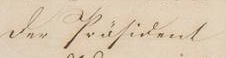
Der Präsident
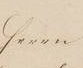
Herrn
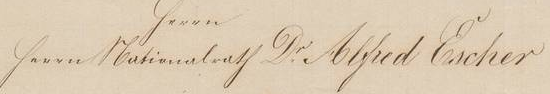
Herrn Nationalrath Dr Alfred Escher
